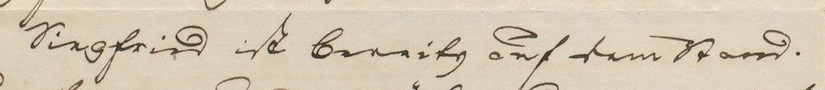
Siegfried ist bereits auf dem Stand-
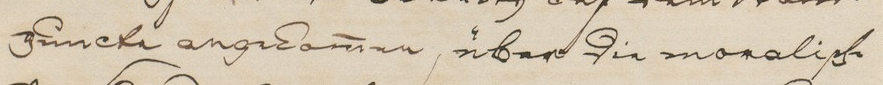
puncte angekommen, über die moralische
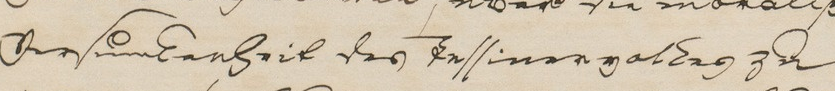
Versunkenheit des Tessinervolkes zu
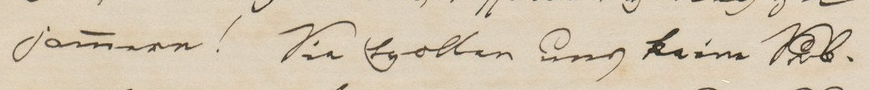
jammern! Sie wollen uns keine Sub-
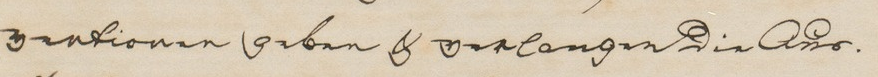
ventionen geben & verlangen die Aus-
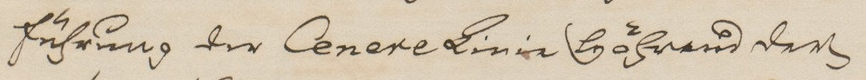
führung der Cenere Linie während der
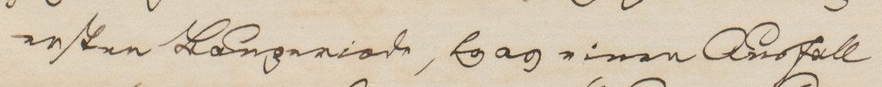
ersten Bauperiode, was einen Ausfall
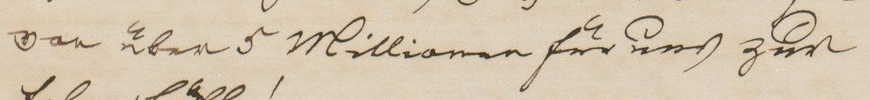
von über 5 Millionen für uns zur
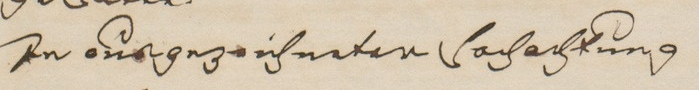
In ausgezeichneter Hochachtung
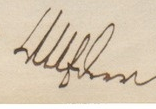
Escher
